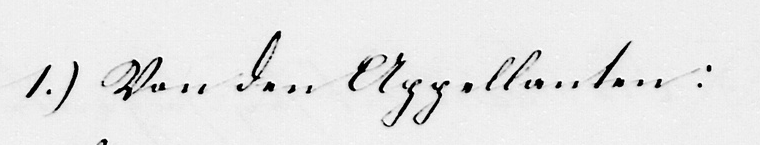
1.) Von den Appellanten:
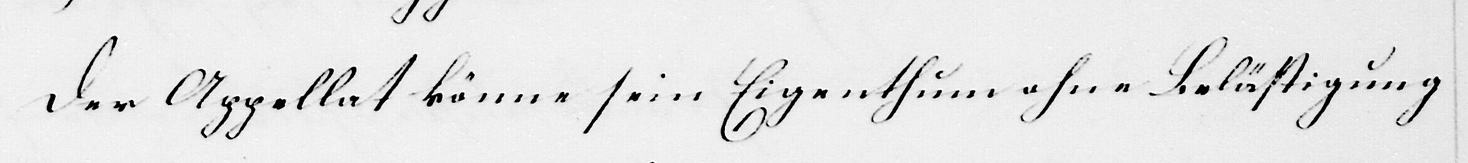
Der Appellat könne sein Eigenthum ohne Belästigung
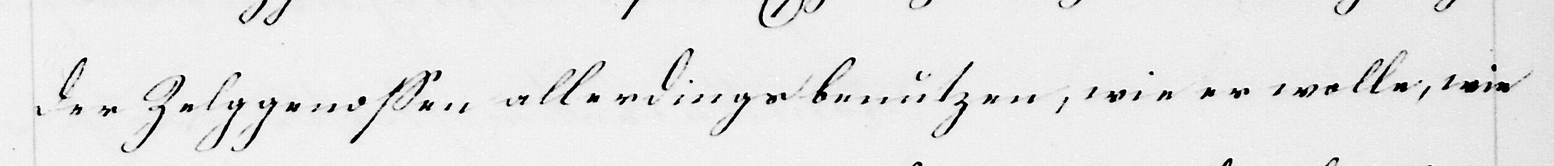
der Zelggenoßen allerdings benützen, wie er wolle, wie
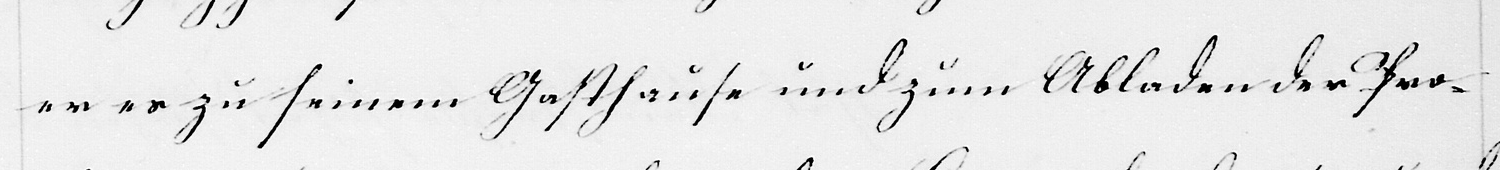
er es zu seinem Gasthause und zum Abladen der Pro¬
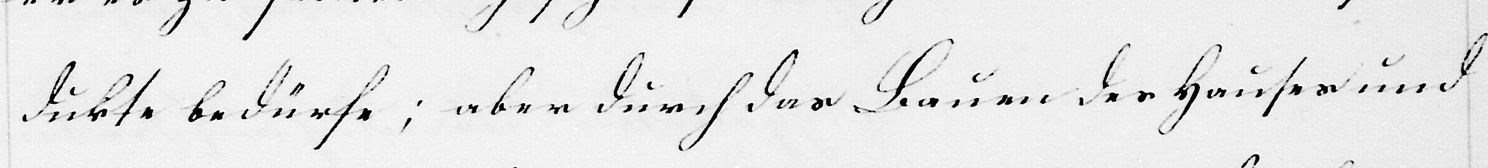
dukte bedürfe; aber durch das Bauen des Hauses und
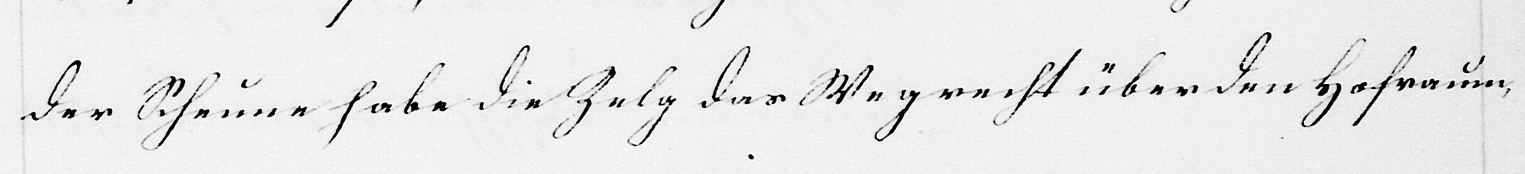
der Scheune habe die Zelg das Wegrecht über den Hofraum
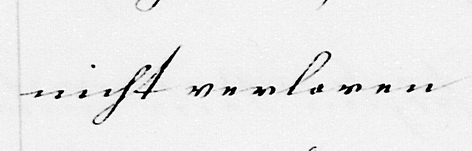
nicht verloren.
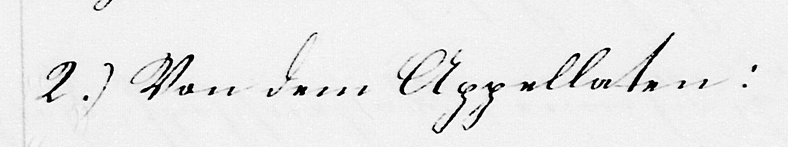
2.) Von dem Appellaten:
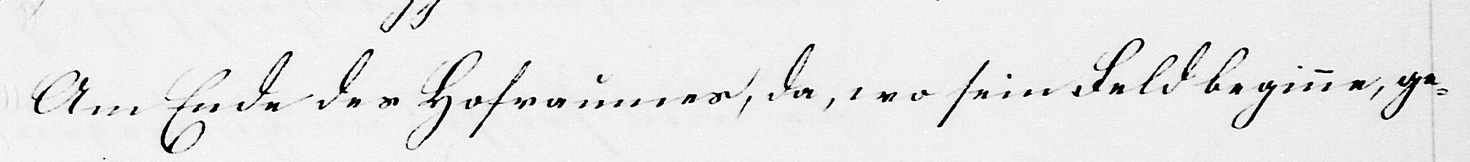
Am Ende des Hofraumes, da, wo sein Feld beginne, ge¬
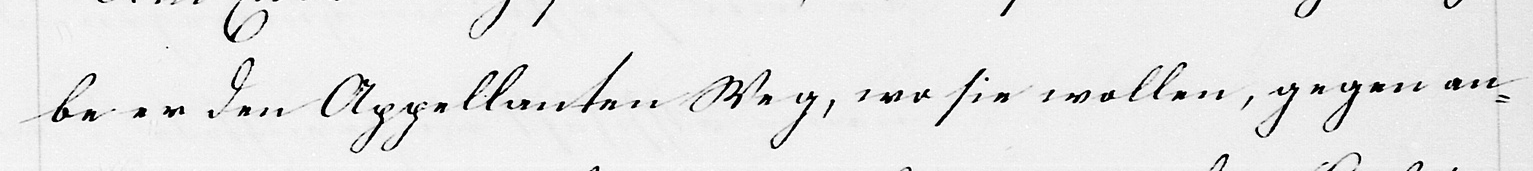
be er den Appellanten Weg, wo sie wollen, gegen an¬
